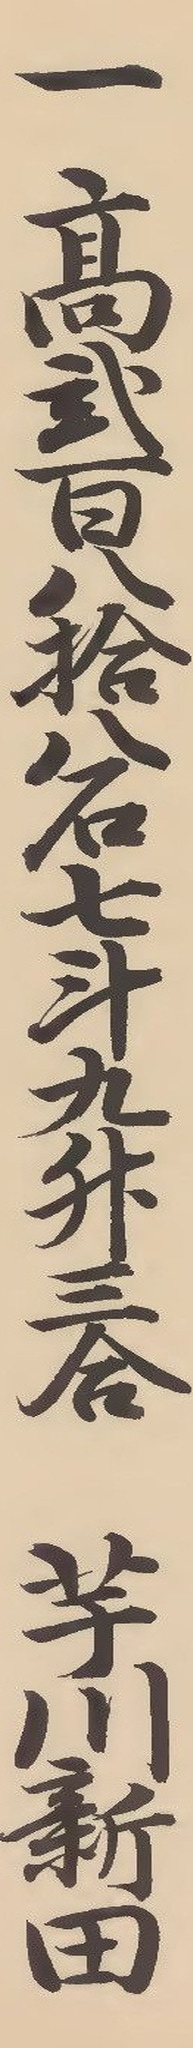一高弐百八拾八石七斗九升三合芋川新田
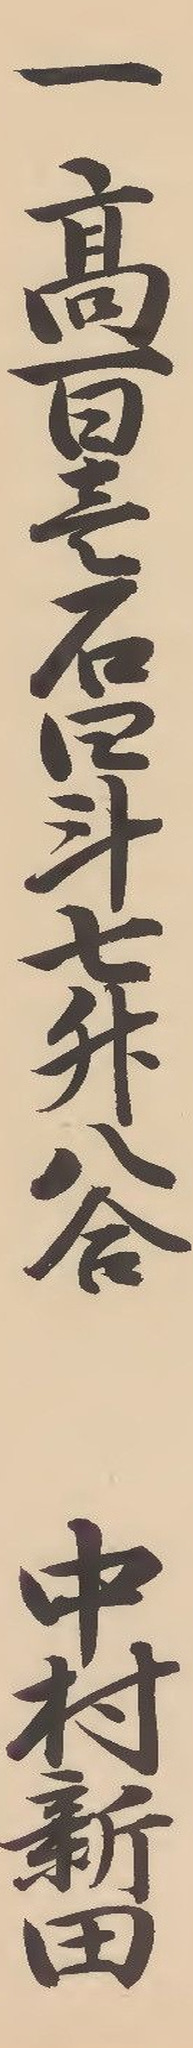一高百壱石四斗七升八合中村新田

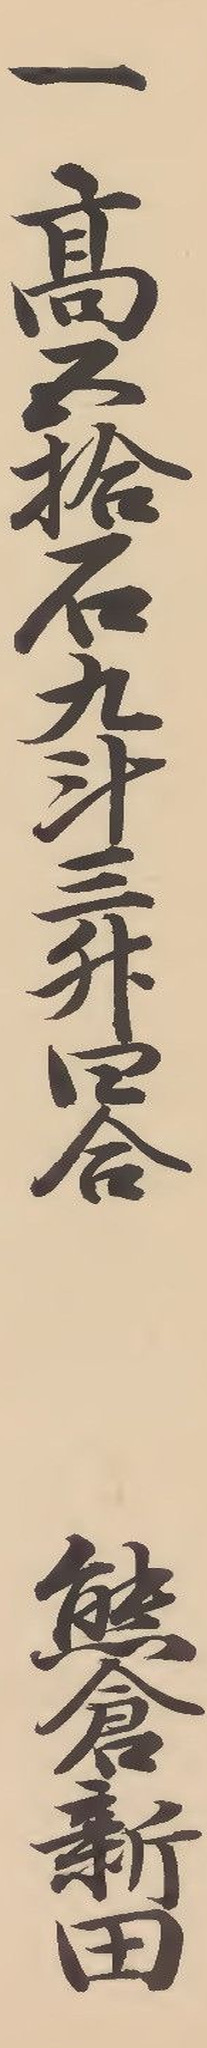一高五拾石九斗三升四合熊倉新田
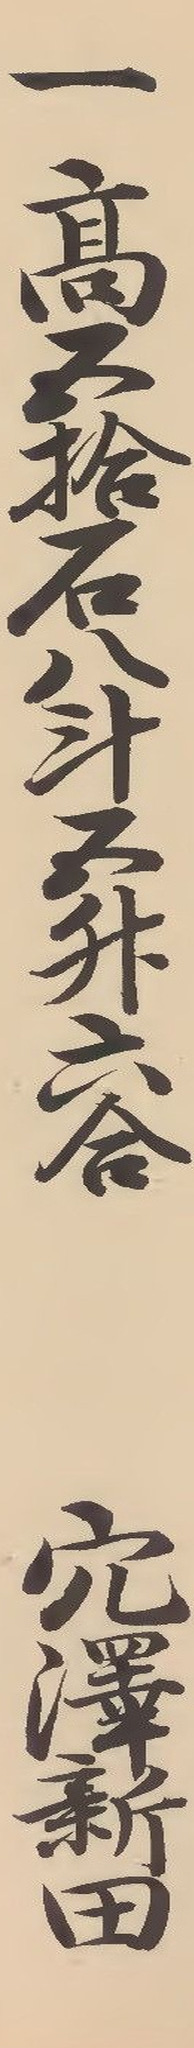一高五拾石八斗五升六合穴沢新田
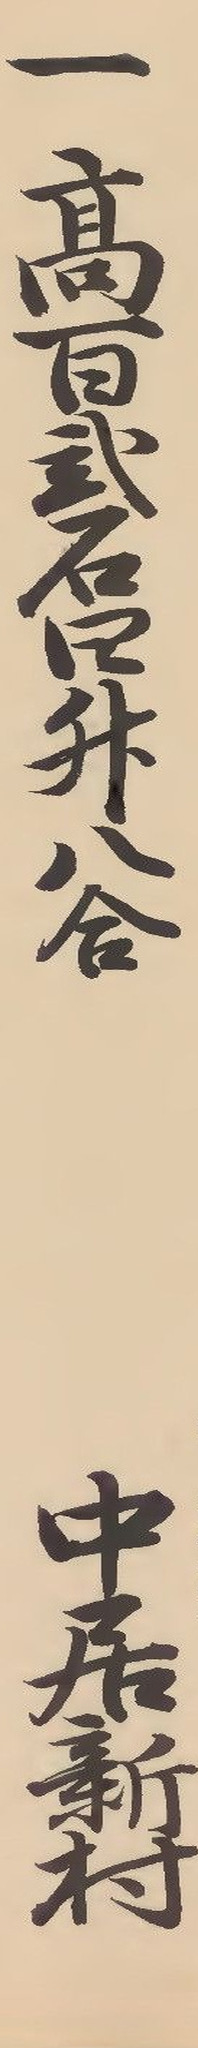一高百弐石四升八合中居新村
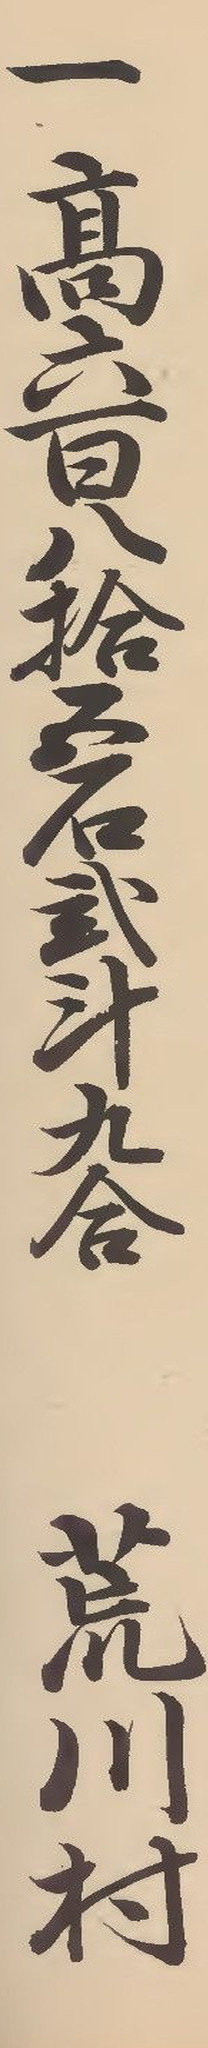一高六百八拾五石弐斗九合荒川村
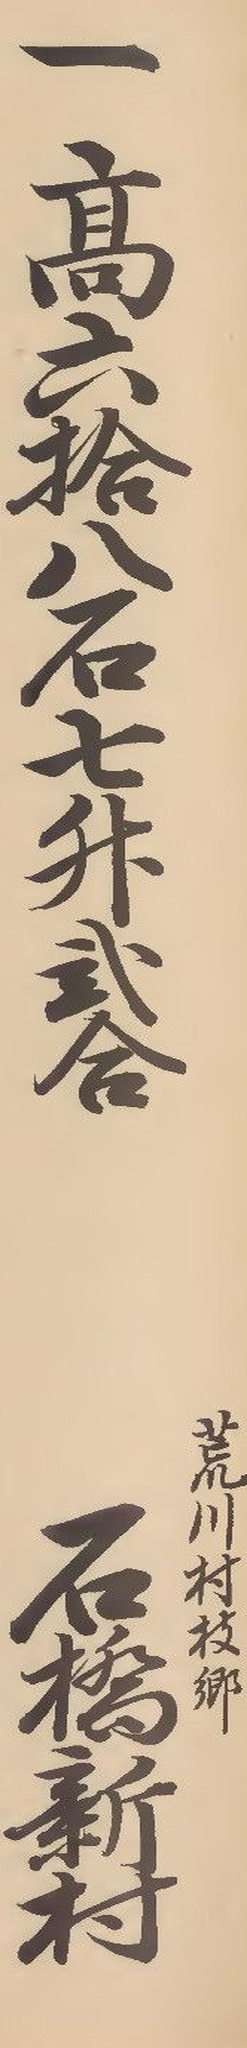一高六拾八石七升弐合石橋新村
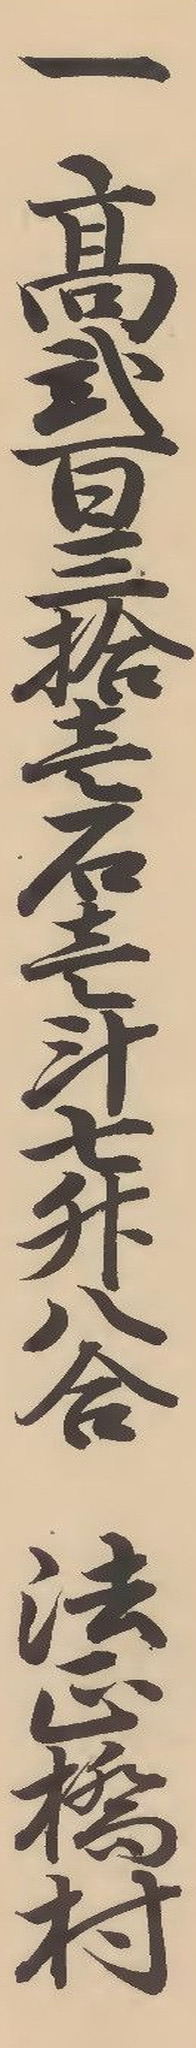一高弐百三拾壱石壱斗七升八合法正橋村
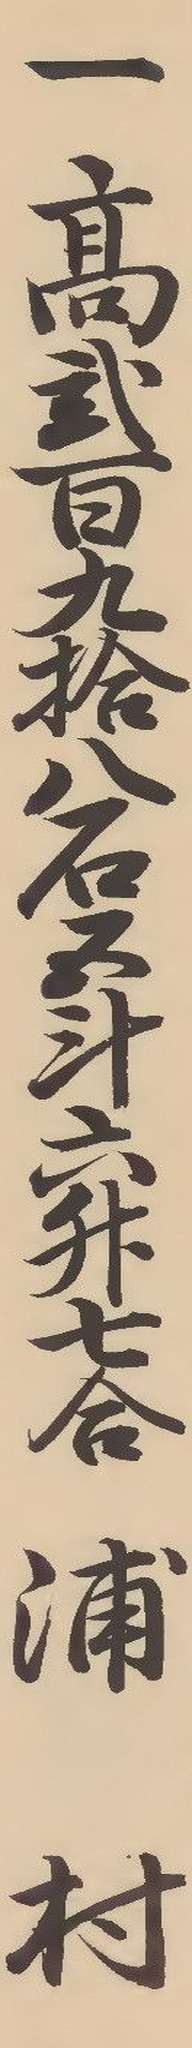一高弐百九拾八石五斗六升七合浦村
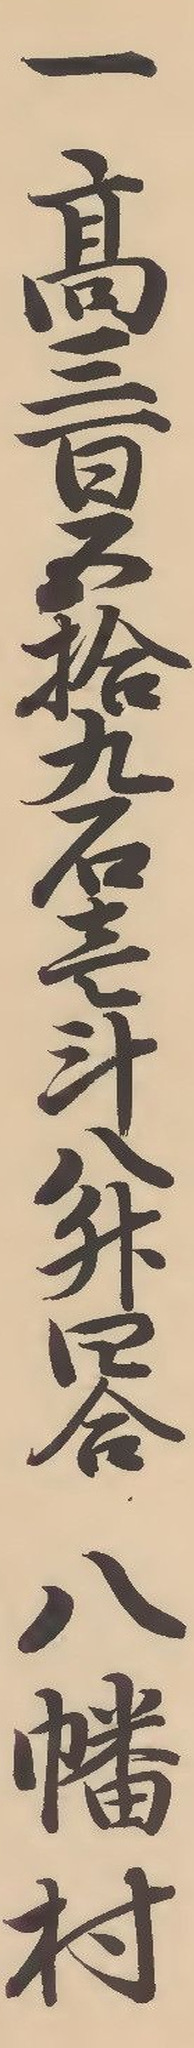一高三百五拾九石壱斗八升四合八幡村

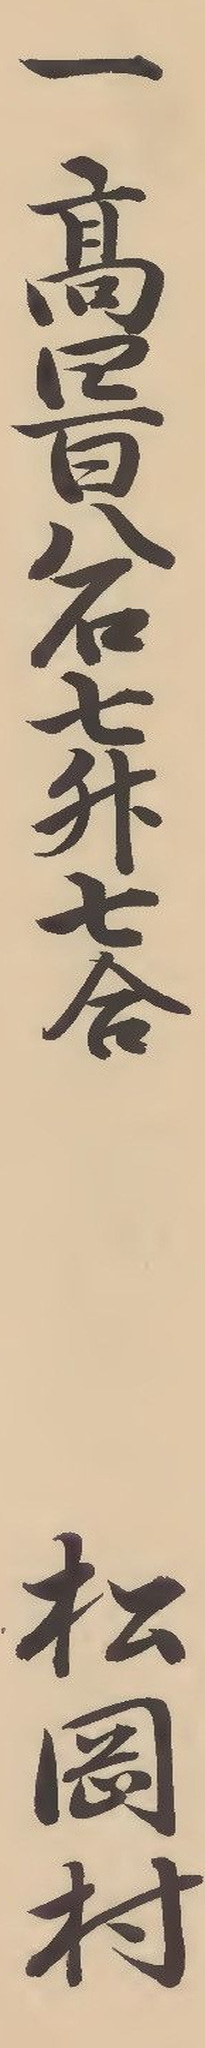一高四百八石七升七合松岡村
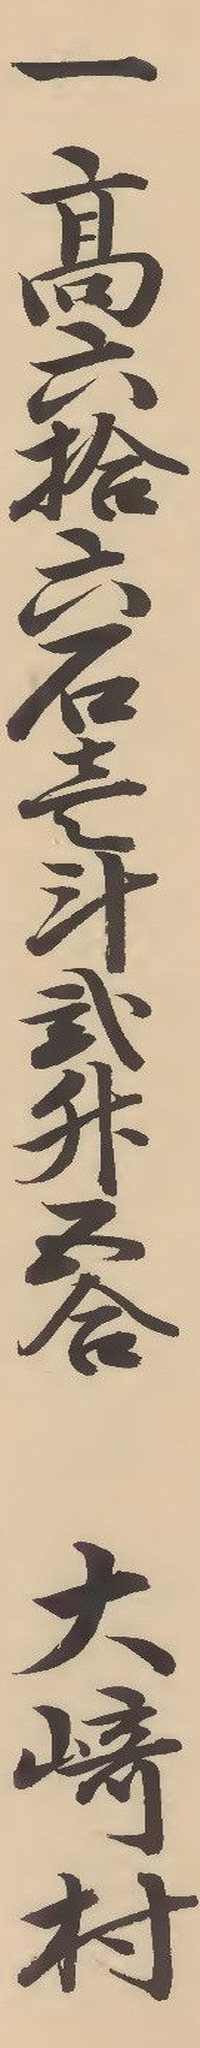一高六拾六石壱斗弐升五合大崎村
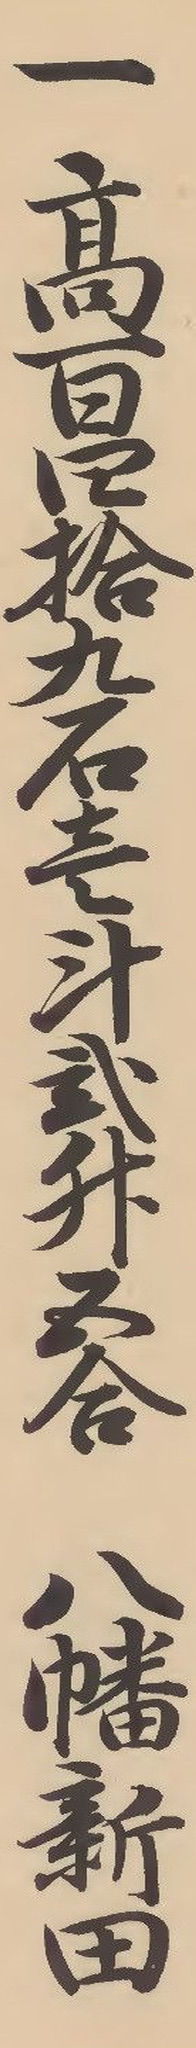一高百四拾九石壱斗弐升五合八幡新田
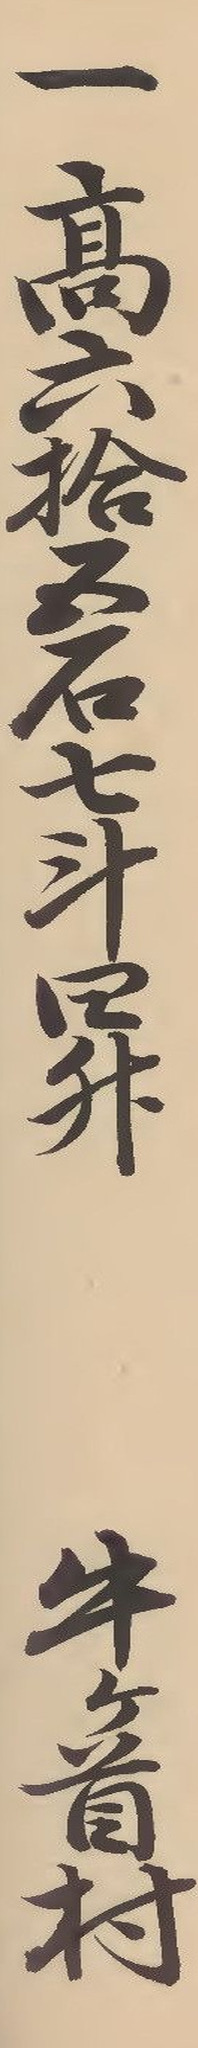一高六拾五石七斗四升牛ヶ首村
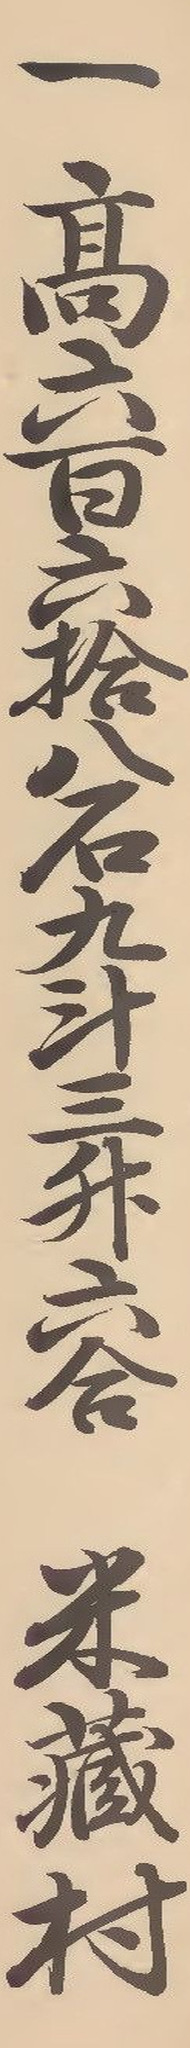一高六百六拾八石九斗三升六合米蔵村
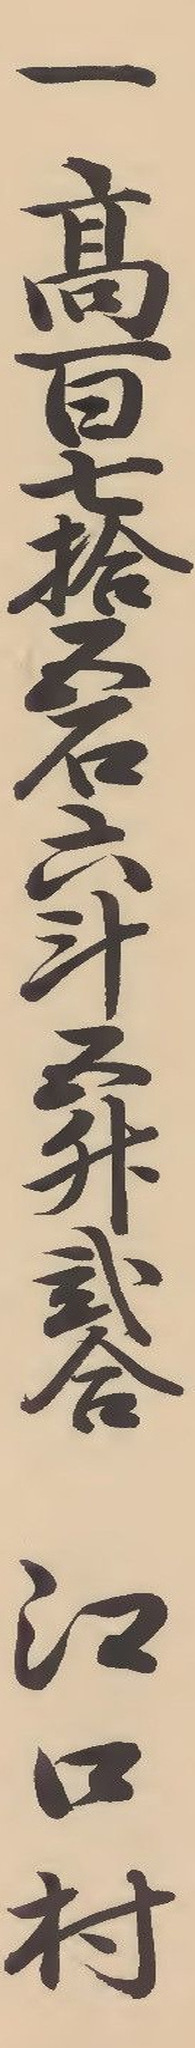一高百七拾五石六斗五升弐合江口村
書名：越後国郷帳　下
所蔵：国立公文書館 National Archives of Japan
